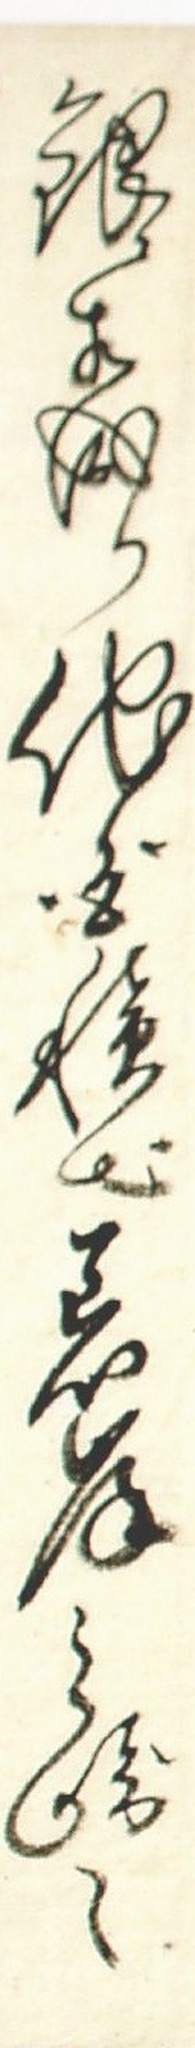銀に相成り他国積出着岸之崎々
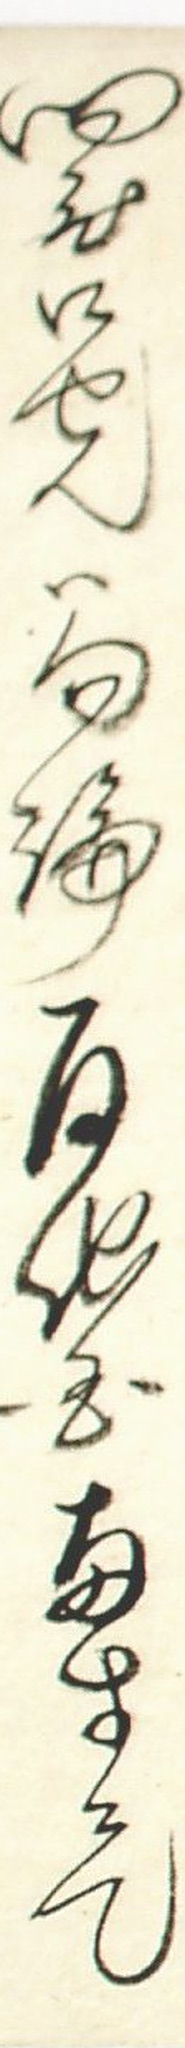問屋口せんは勿論自他国両方にて
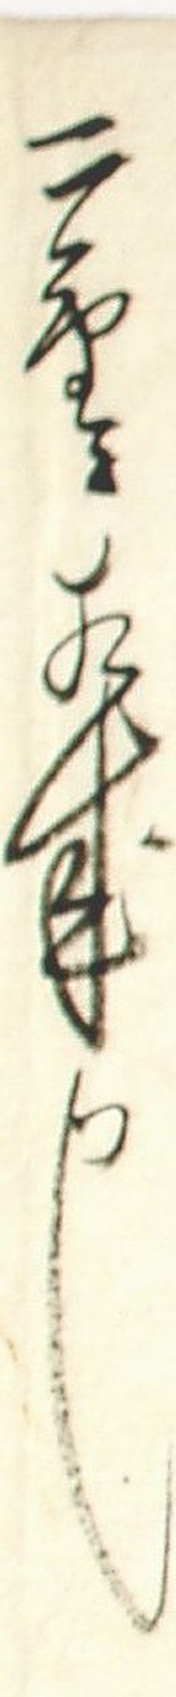二重に相成申候
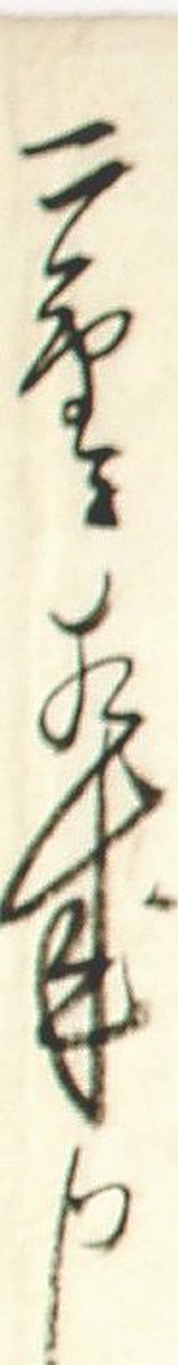二重に相成申候
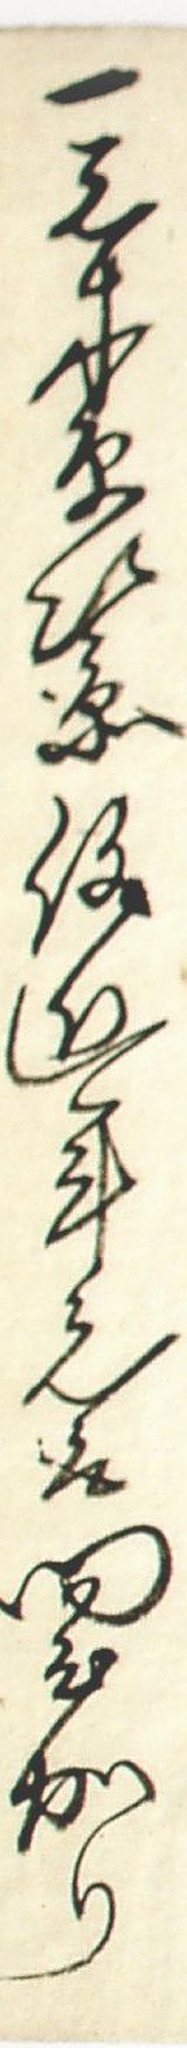一元木平次兵衛儀近年元取問屋加り
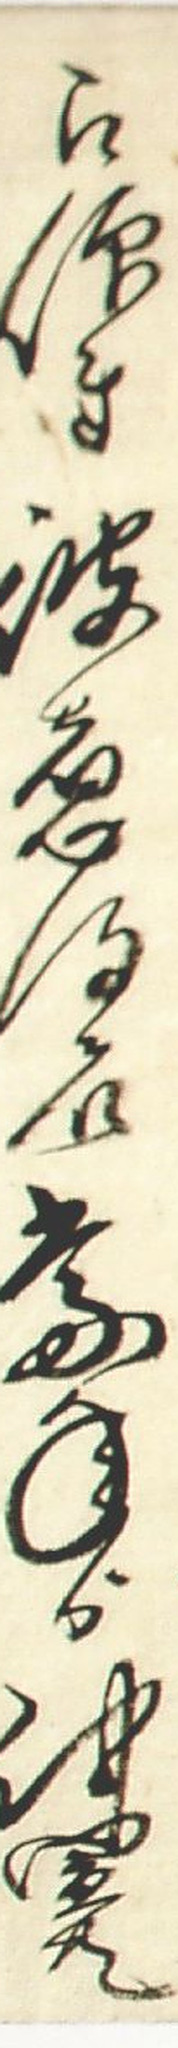被仰付彼者心得を以当年ゟ仲買共

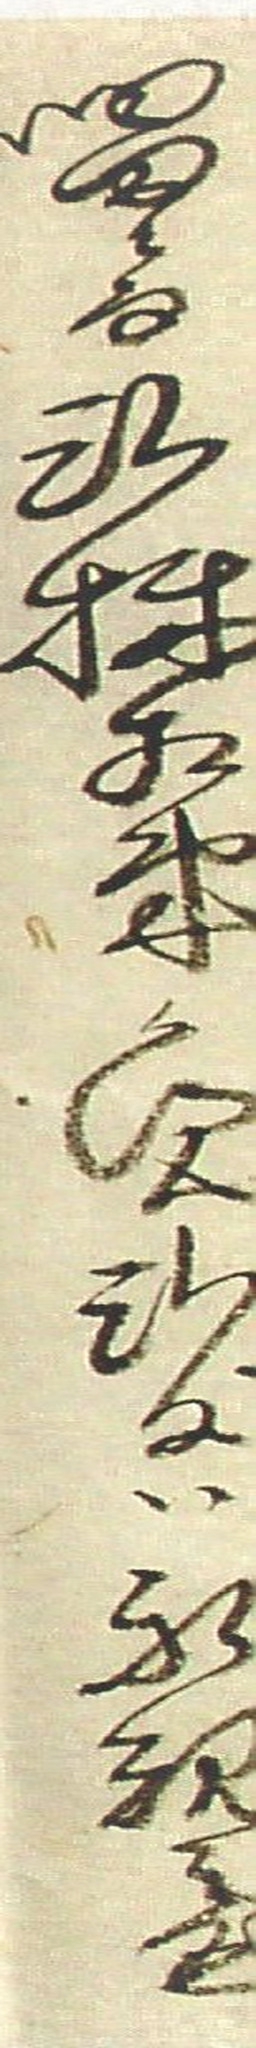唱にて弐株相束候得は弐匁は新規之懸
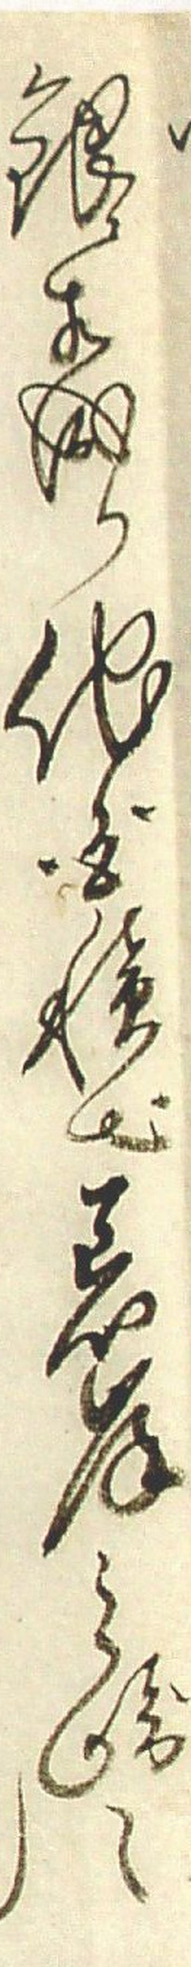銀に相成り他国積出着岸之崎々
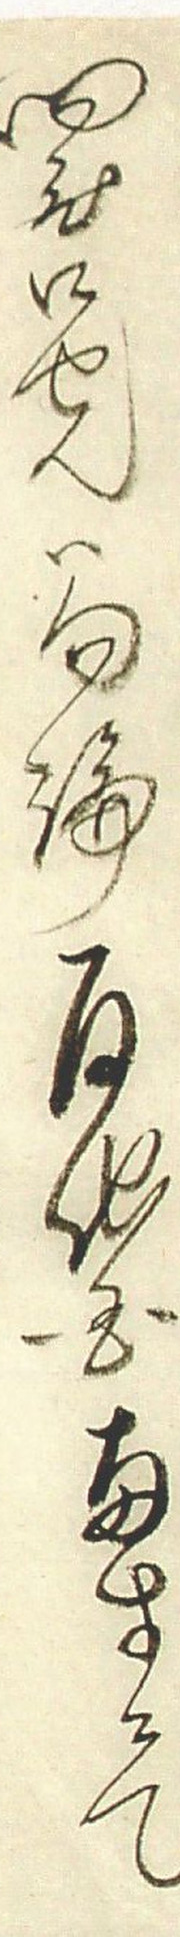問屋口せんは勿論自他国両方にて
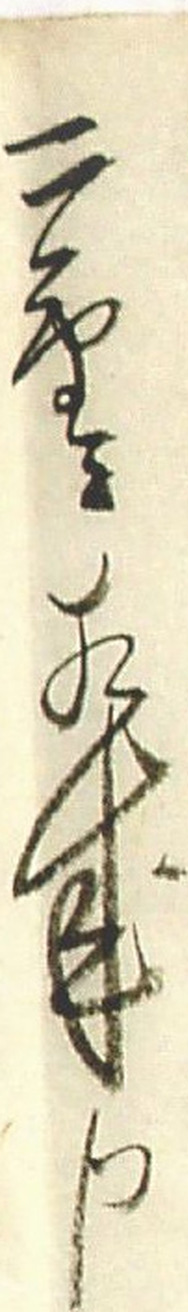二重に相成申候
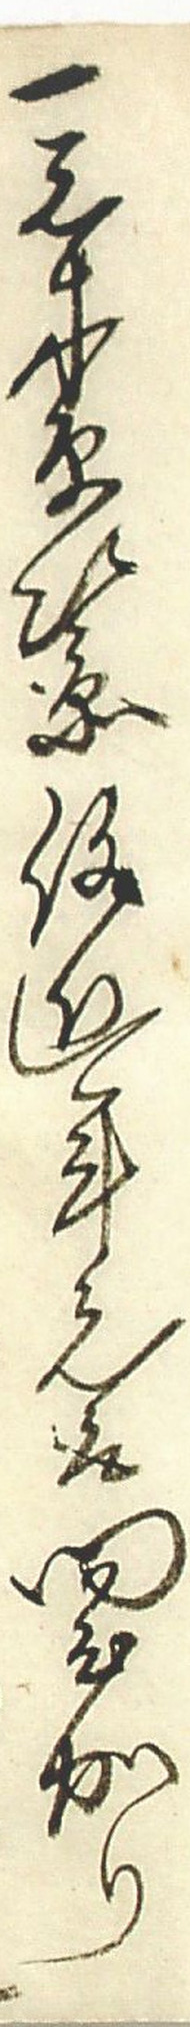一元木平次兵衛儀近年元取問屋加り
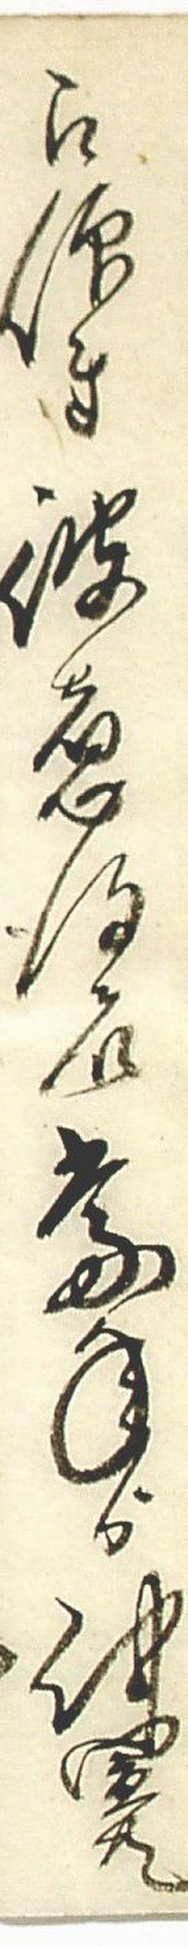被仰付彼者心得を以当年ゟ仲買共
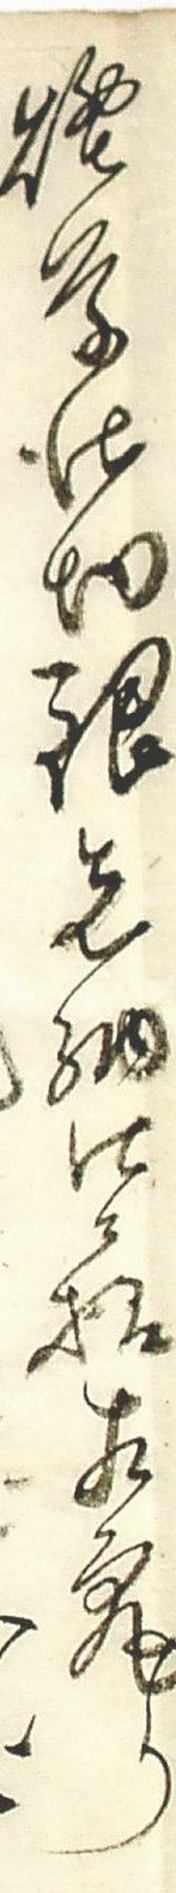煙草仕切銀先納仕候様相究り
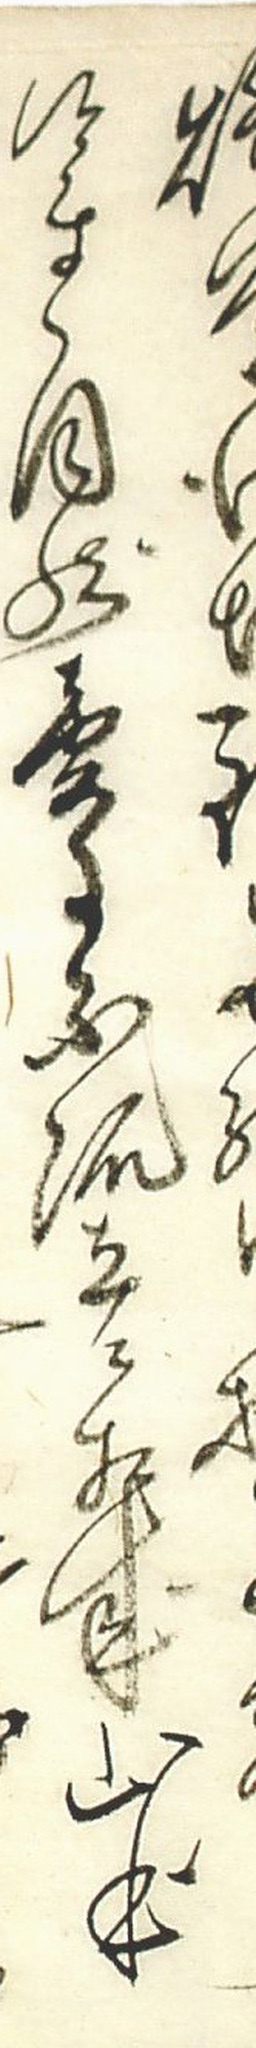候に付自然売手不派立に相成山本
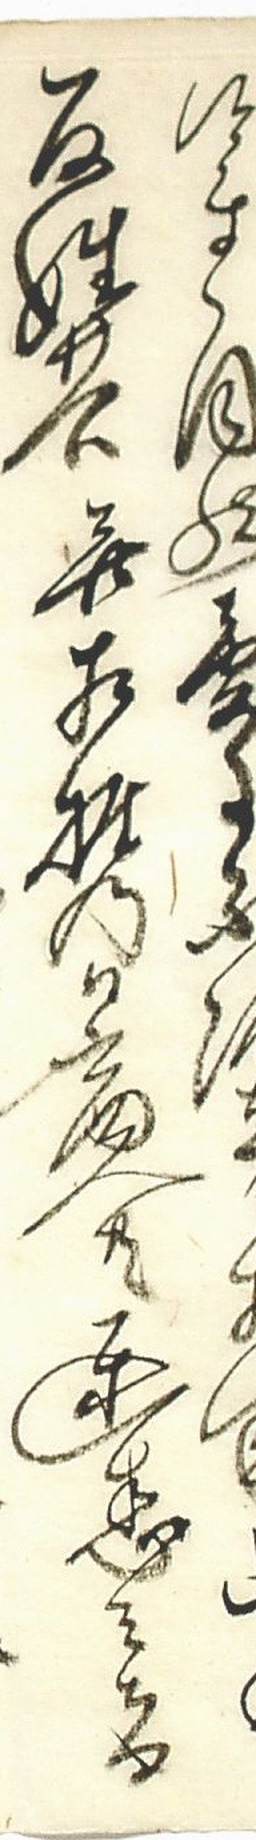百姓共并相携候商人共迷惑之旨
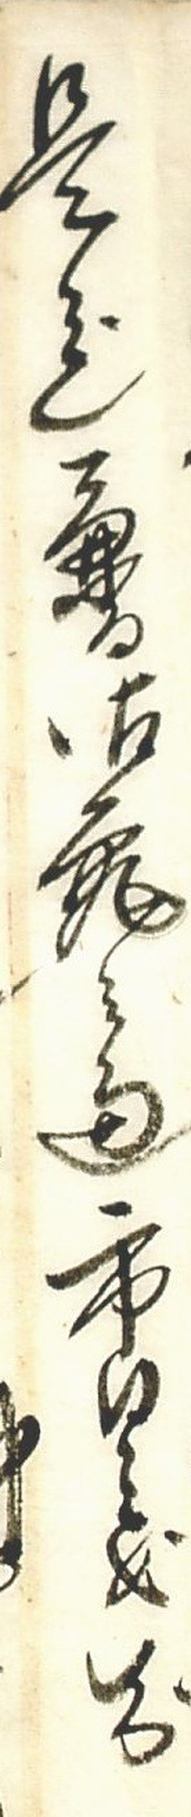是迄兼て御究之通市日之義前
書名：煙草問屋扱方一件他
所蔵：鳴門教育大学 Naruto University of Education
